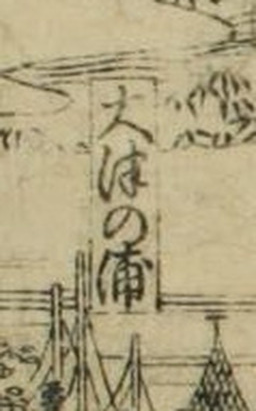大津の浦
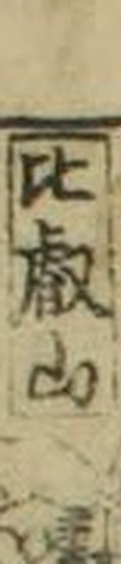比叡山

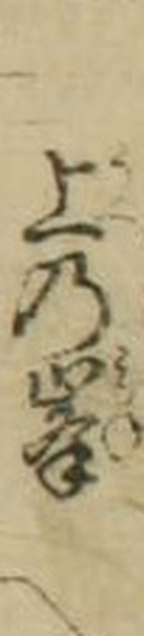浪上の峯
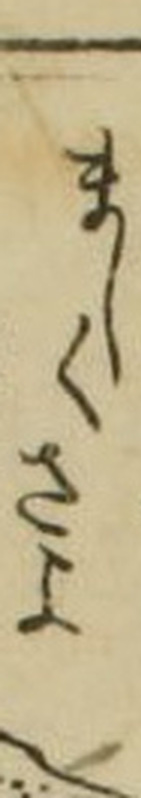ましく跡に
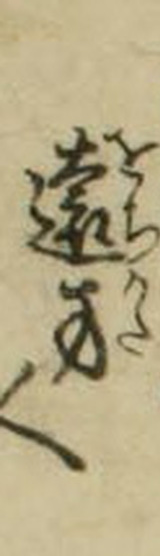遠方空

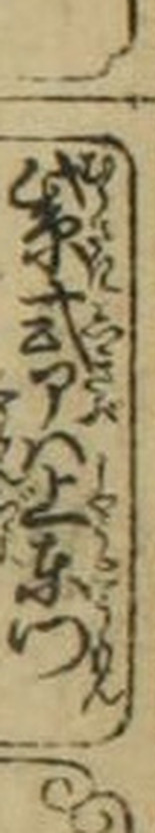紫式部は上東門
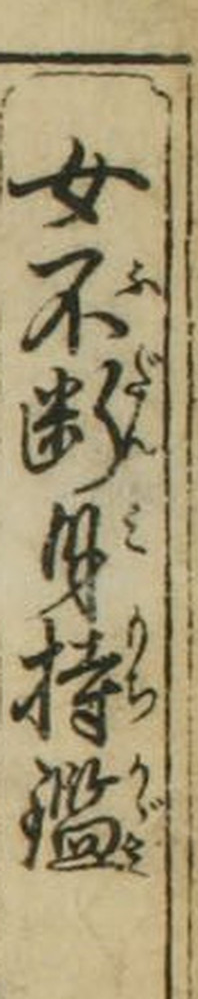女不断身持鑑
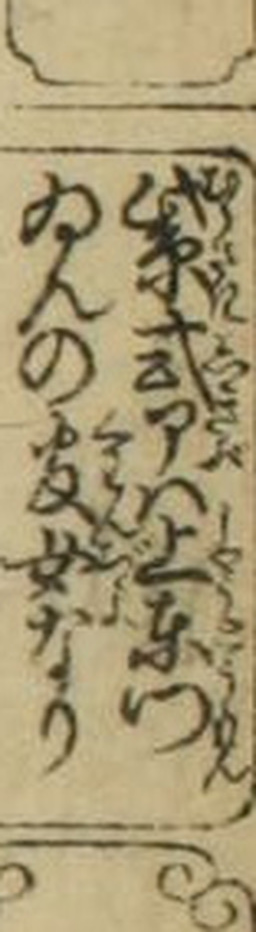ゐんの官女なり
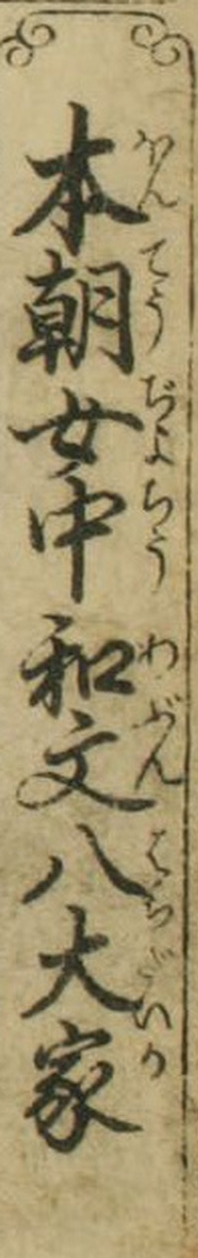本朝女中和文八大家
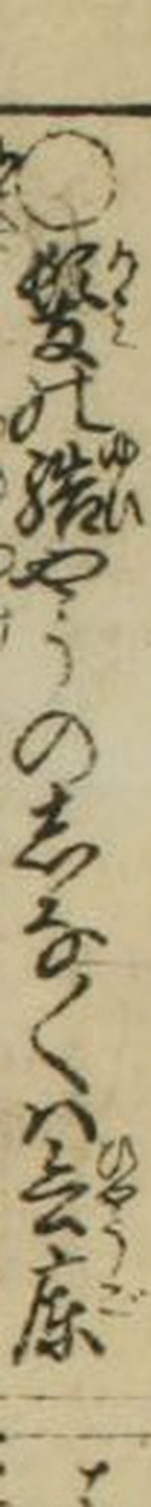◯髪の結やうのしな〳〵は兵庫
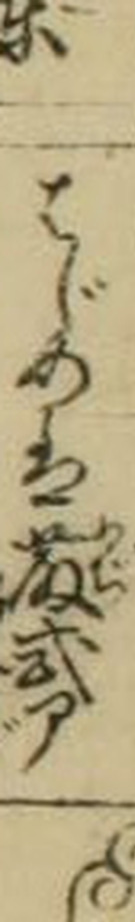はじめは藤式部
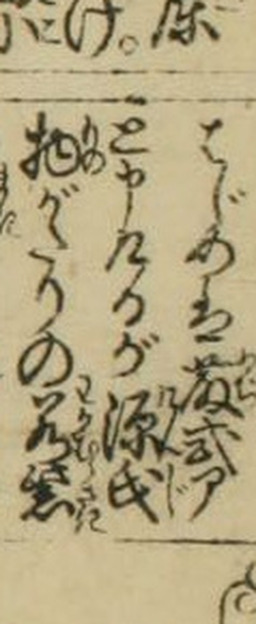と申けるが源氏
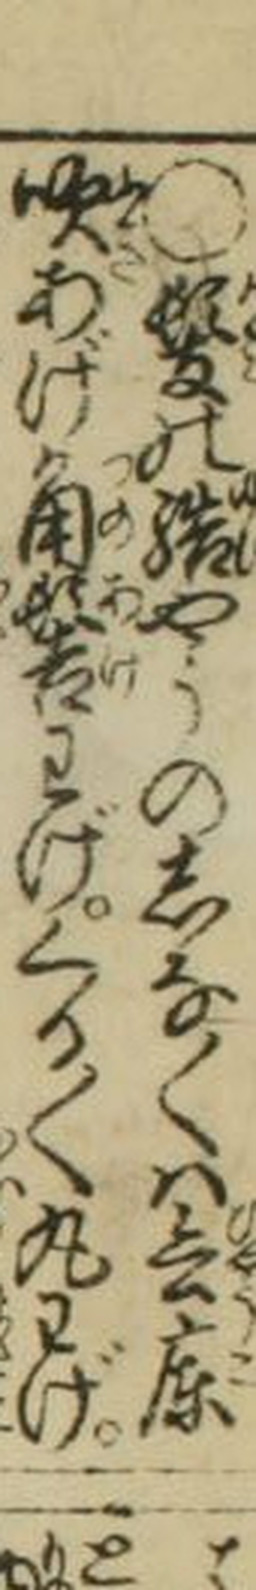吹あげ角磐わげ。くる〳〵丸わげ。
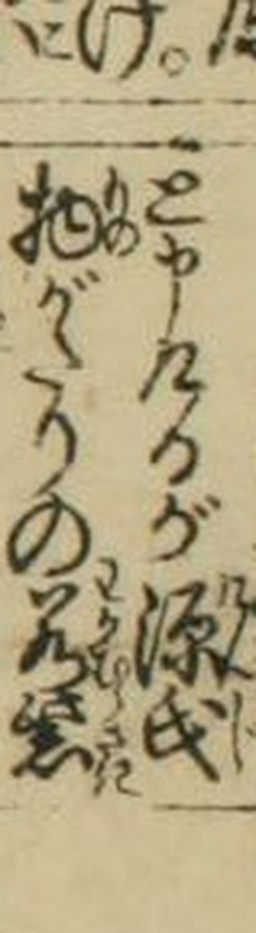物がたりの若紫
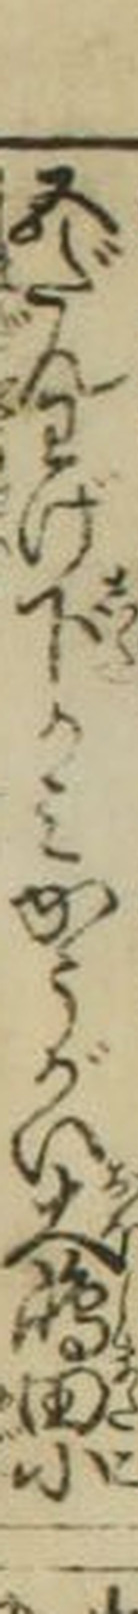五だんわげ下かみかうがい大嶋田小
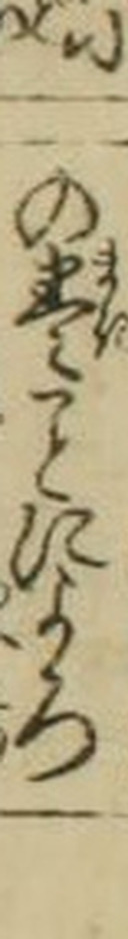の巻つとによろ
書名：女源氏教訓鑑
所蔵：東京学芸大学附属図書館
